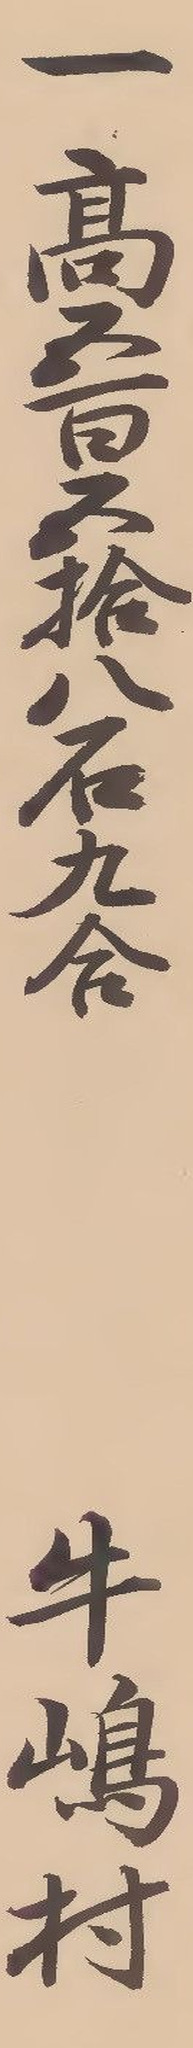一高五百五拾八石九合牛嶋村
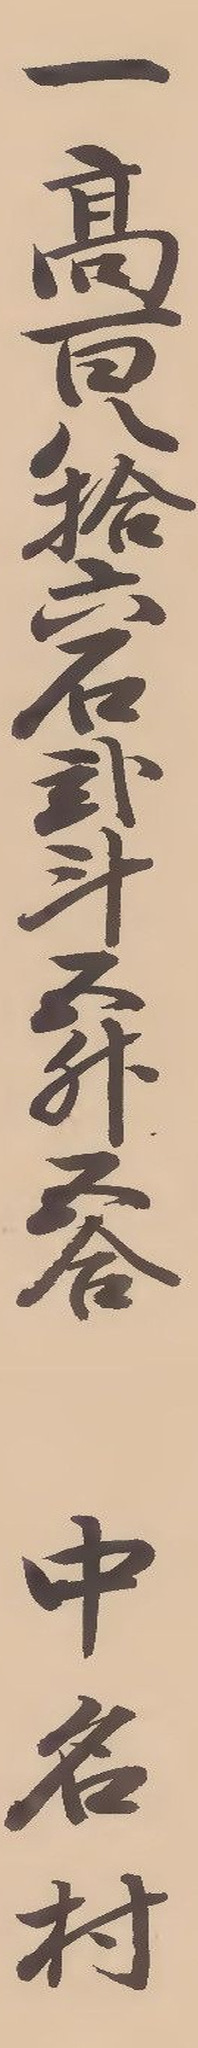一高百八拾六石弐斗五升五合中名村
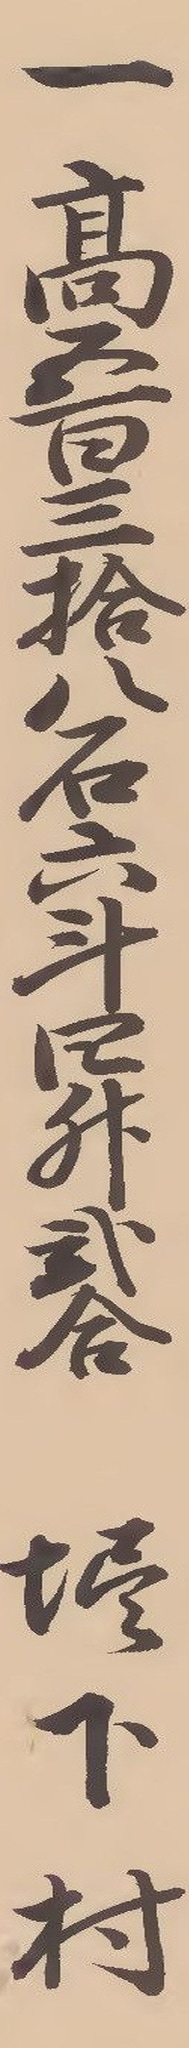一高五百三拾八石六斗四升弐合壗下村
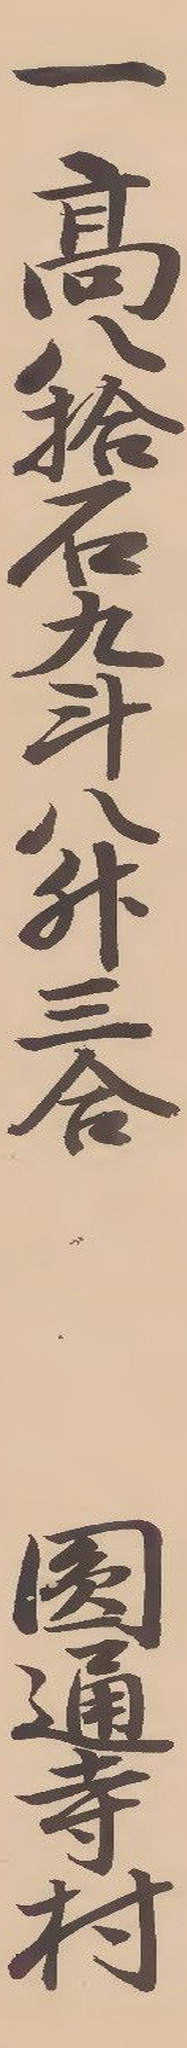一高八拾石九斗八升三合円通寺村
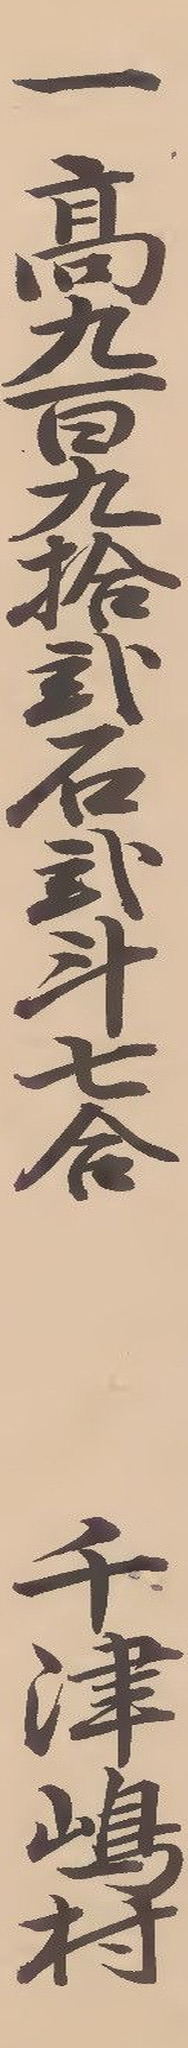一高九百九拾弐石弐斗七合千津嶋村
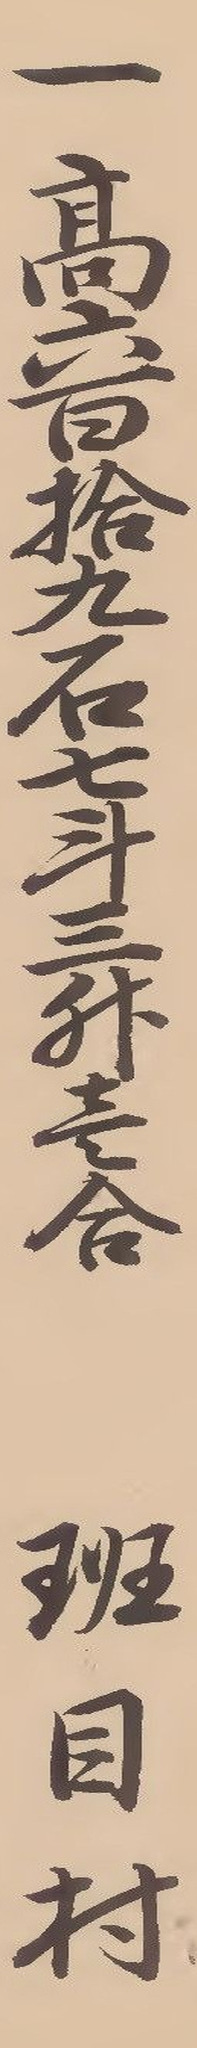一高六百拾九石七斗三升壱合班目村
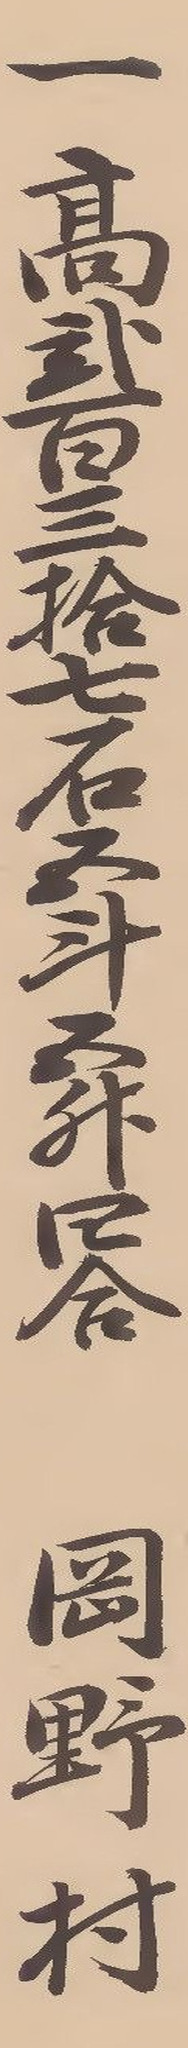一高弐百三拾七石五斗五升四合岡野村
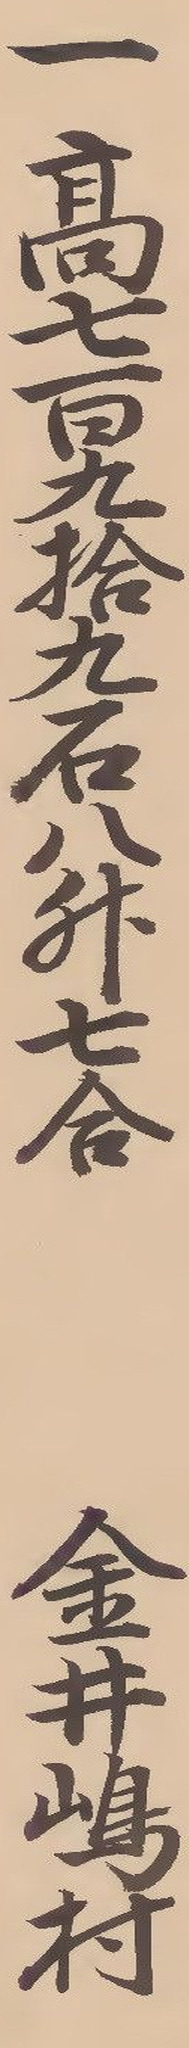一高七百九拾九石八升七合金井嶋村

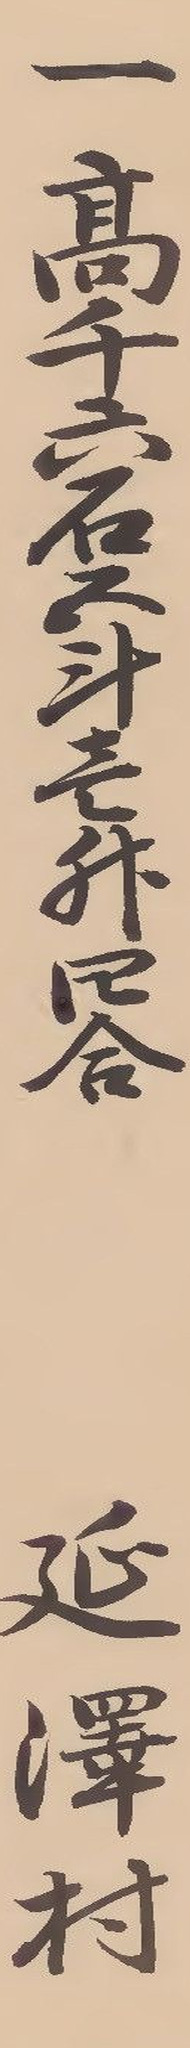一高千六石五斗壱升四合延澤村
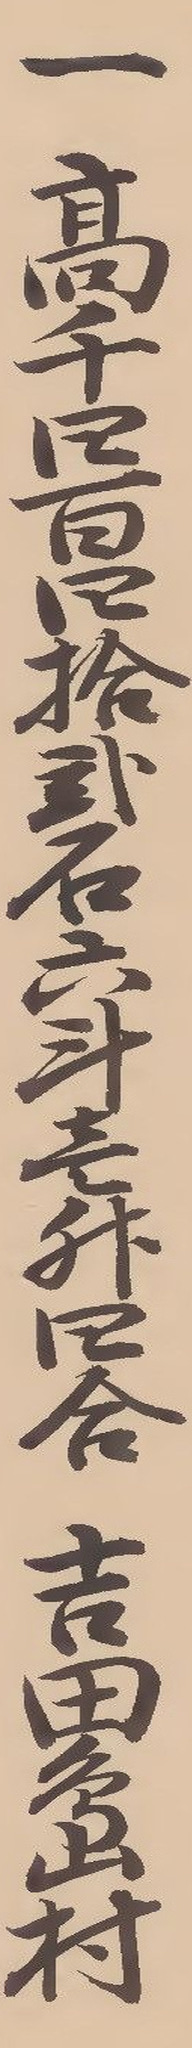一高千四百四拾弐石六斗壱升四合吉田島村
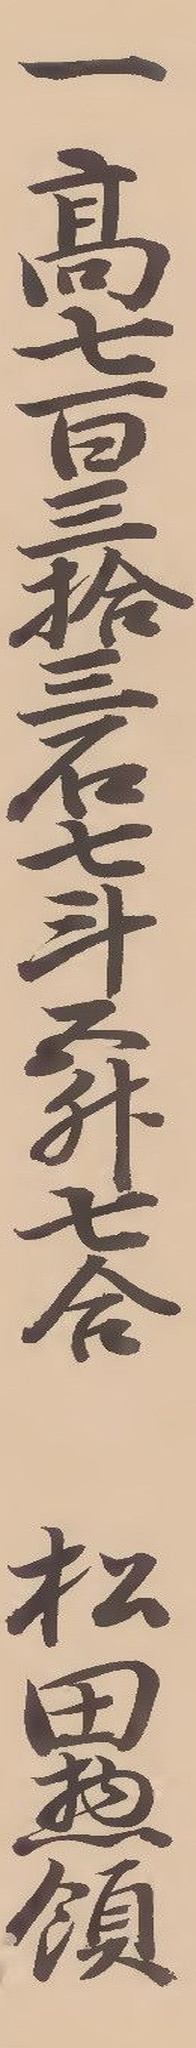一高七百三拾三石七斗五升七合松田惣領
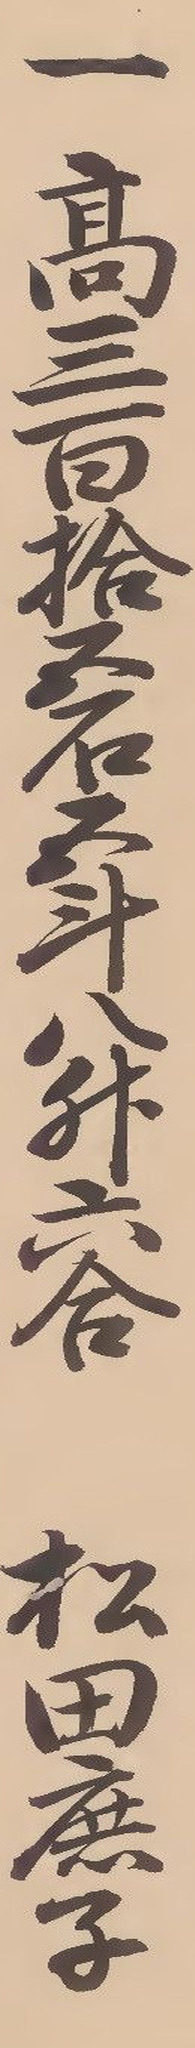一高三百拾五石五斗八升六合松田庶子
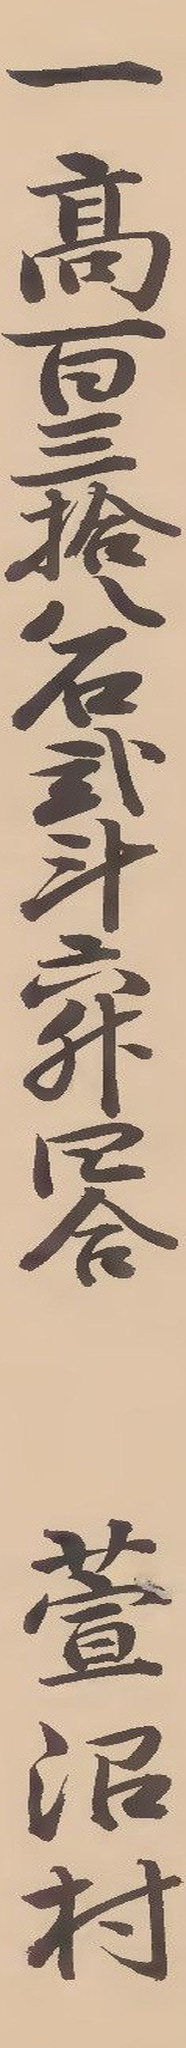一高百三拾八石弐斗六升四合萱沼村
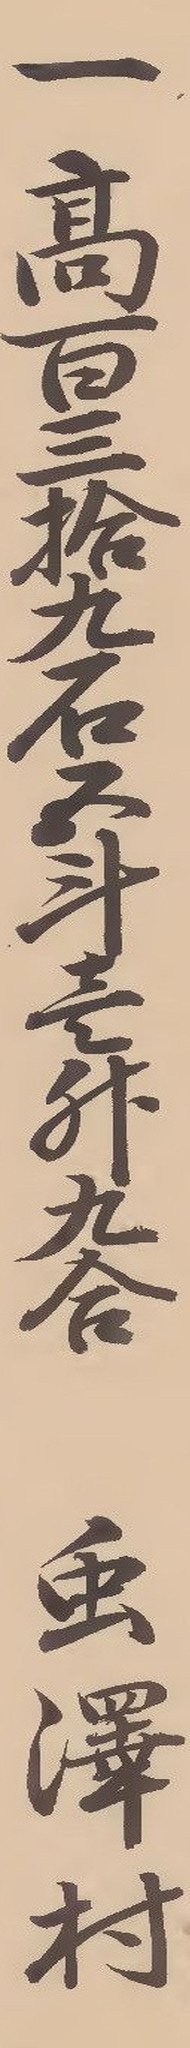一高百三拾九石五斗壱升九合虫澤村
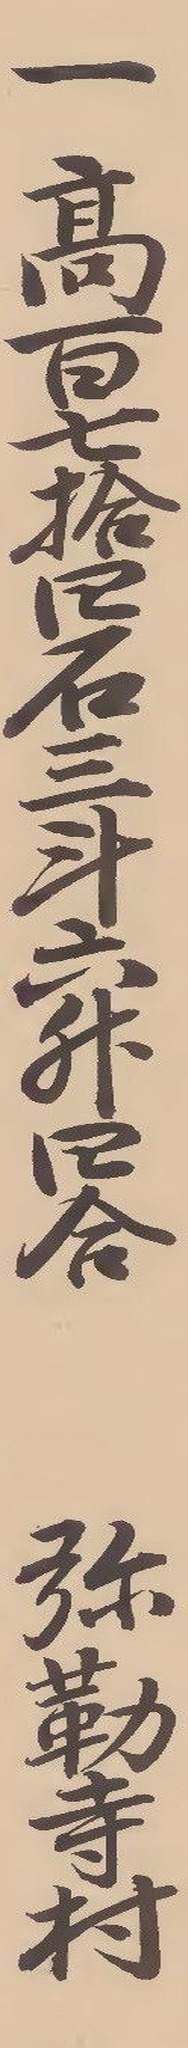一高百七拾四石三斗六升四合弥勒寺村
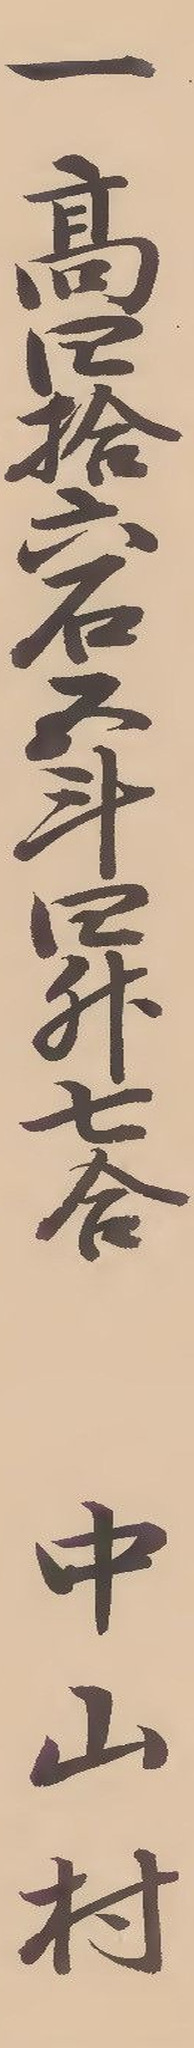一高四拾六石五斗四升七合中山村
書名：相模国郷帳
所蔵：国立公文書館 National Archives of Japan
